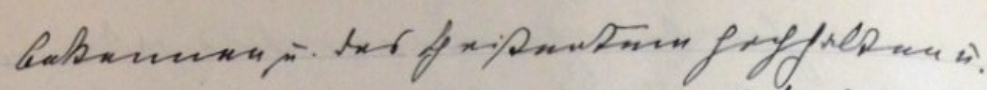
bekennen u. das Christentum hochhalten u.
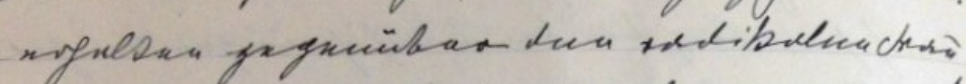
erhalten gegenüber den radikalen Frauen
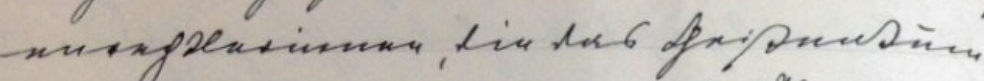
Frauenrechtlerinnen, die das Christentum
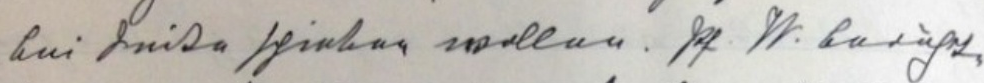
bei Seite schieben wollen. Pf. W. berührte
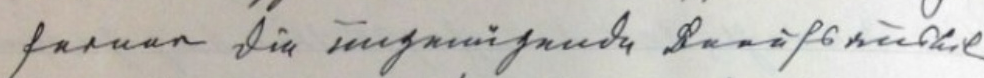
ferner die ungenügende Berufsausbil
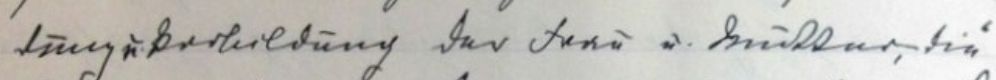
dung u. Vorbildung der Frau u. Mutter, die
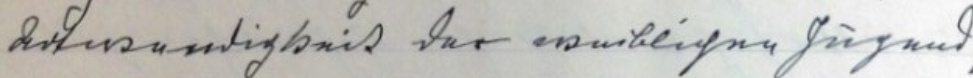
die Notwendigkeit der weiblichen Jugend
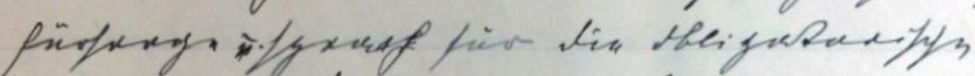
fürsorge u. sprach für die obligatorische
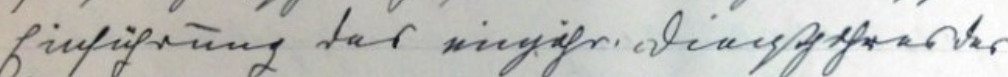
Einführung des einjähr. Dienstjahres des
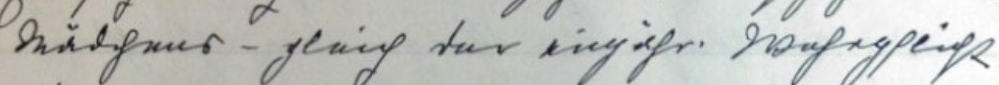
Mädchens gleich der einjähr. Wehrpflicht
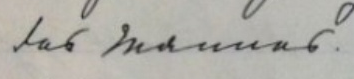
der Männer
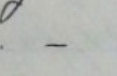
-
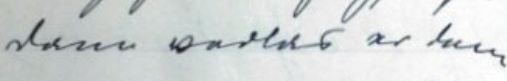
dann verlas er den
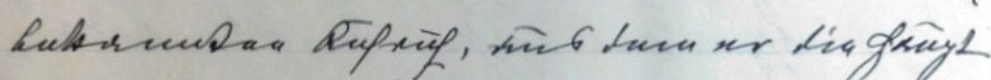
bekannten Aufruf, aus dem er die Haupt
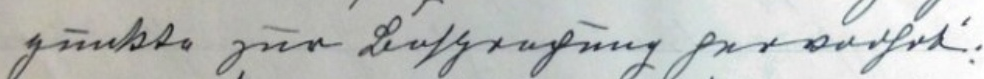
punkte zur Besprechung hervorhob:
